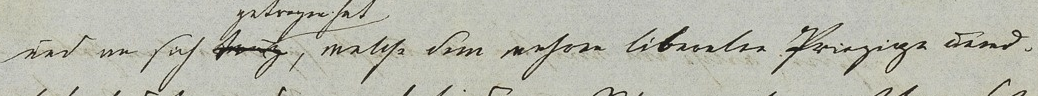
und an sich truggetragen hat, welche dem wahren liberalen Prinzipe unend-
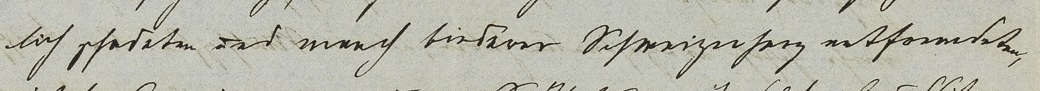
lich schadeten und manch biederes Schweizerherz entfremdeten,
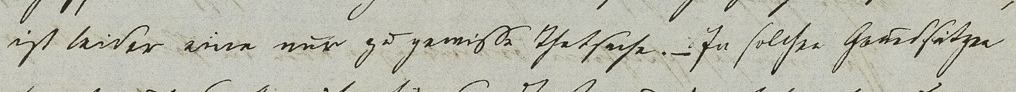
ist leider eine nur zu gewisse Thatsache. – In solchen Grundsätzen
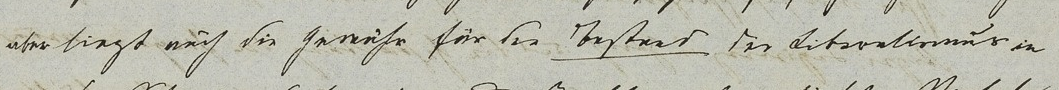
aber liegt auch die Gewähr für den Bestand des Liberalismus in
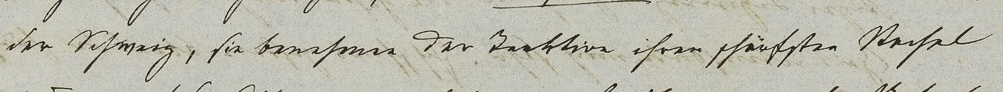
der Schweiz, sie benehmen der Reaktion ihren schärfsten Stachel
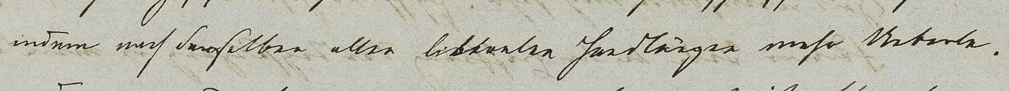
indem nach denselben allen liberalen Handlungen mehr Ueberle-
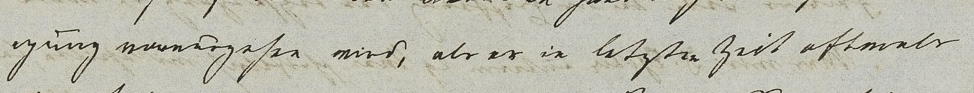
gung vorausgehen wird, als es in letzter Zeit oftmals
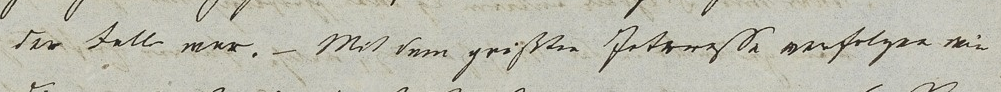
der Fall war. – Mit dem größten Interesse verfolgen wir
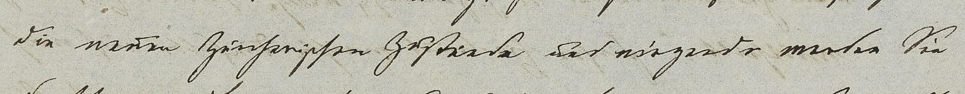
die neuen Zürcherischen Zustände und nirgends werden Sie
